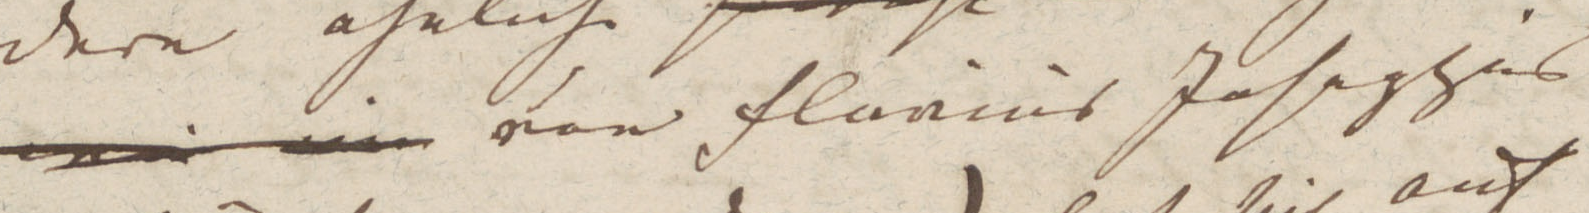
so wie ein von Flavius Josephus
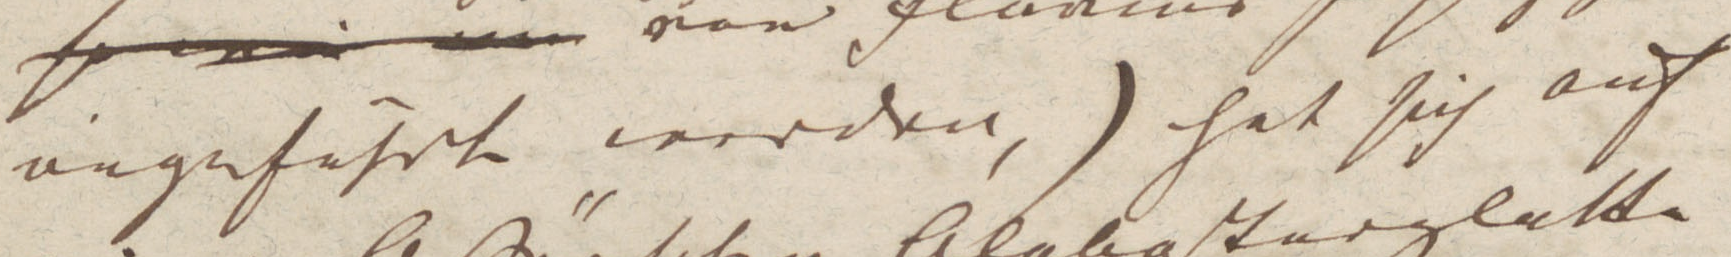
angeführt werden,) hat sich auf
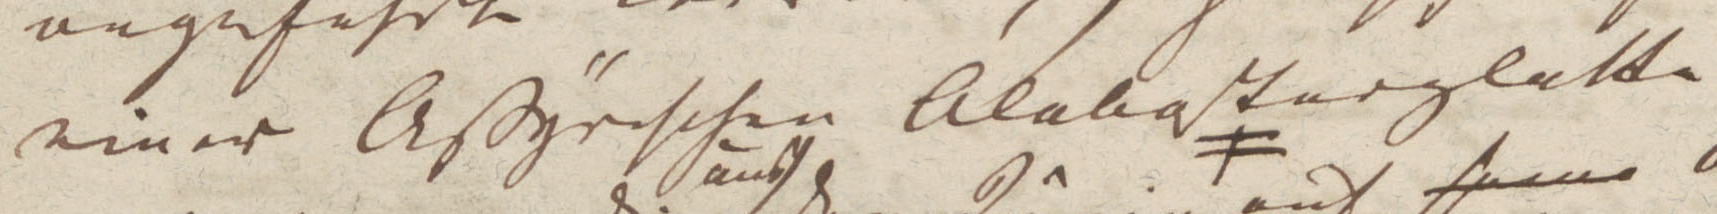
einer Assyrischen Alabasterplatte
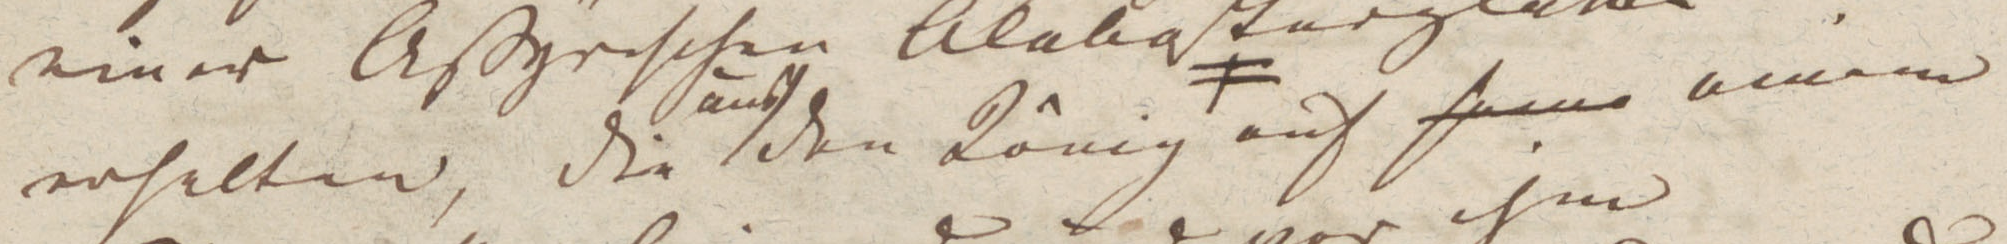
erhalten, die uns den König % auf seine einem
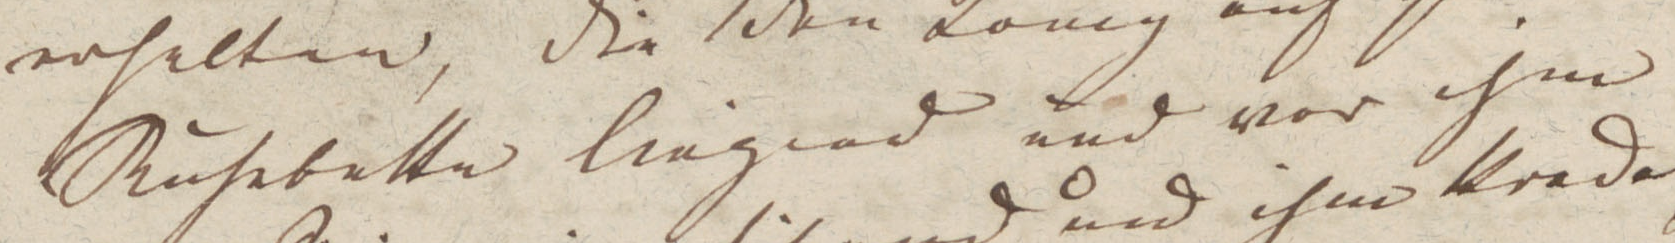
Ruhebette liegend und vor ihm
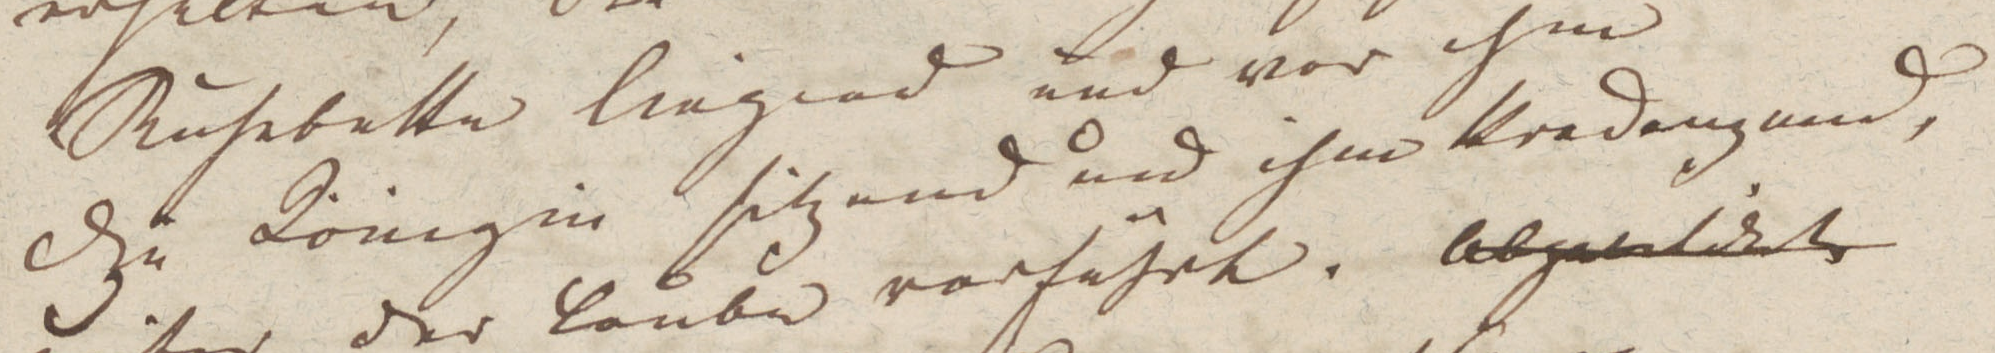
die Königin sitzend und ihm kredenzend,
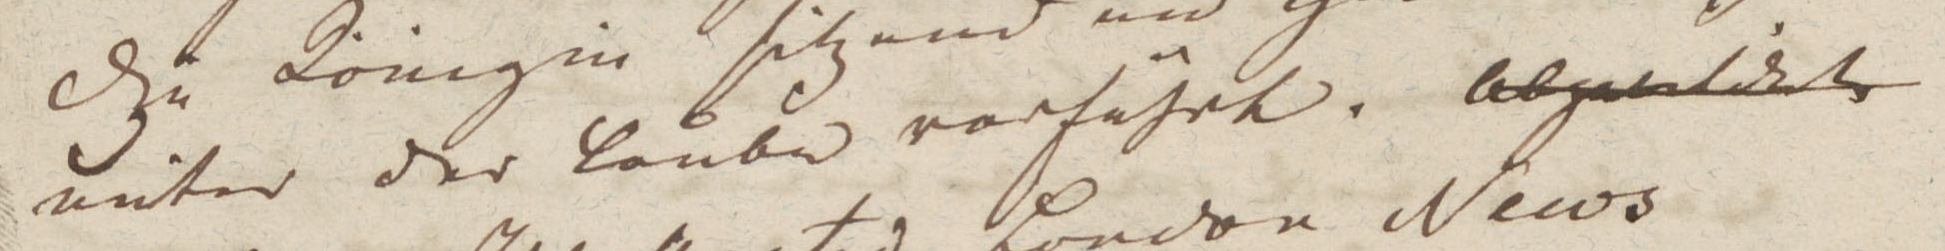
unter der Laube vorführt. Abgebildet
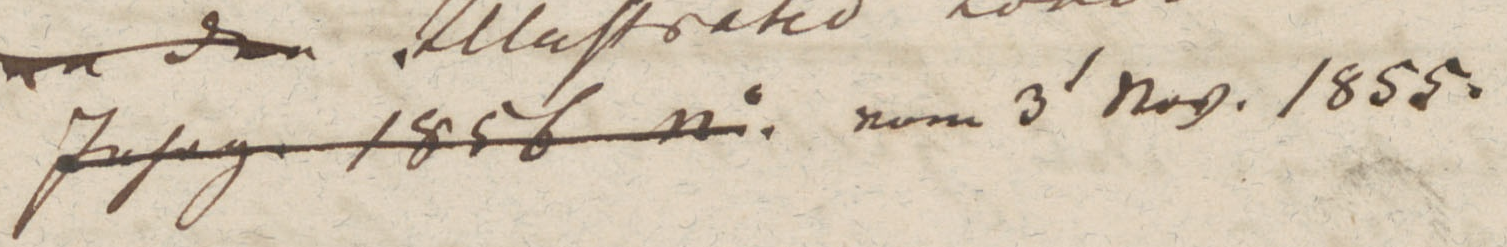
Jahrg. 1856 n° vom 3t Nov. 1855.
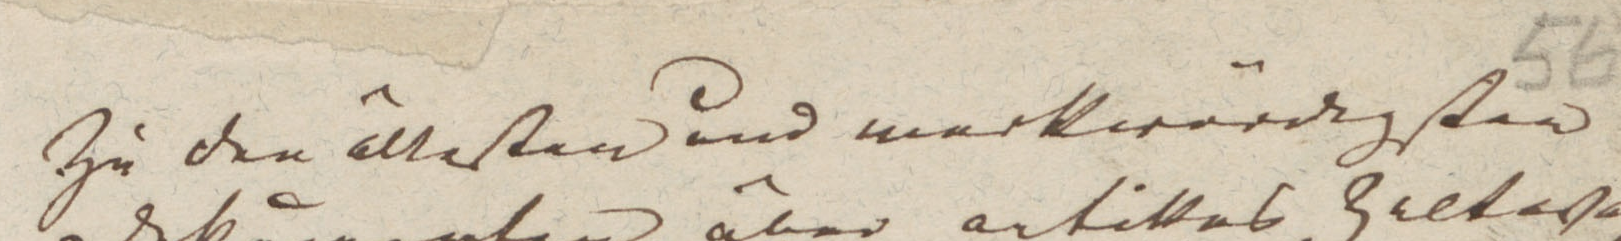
zu den ältesten und merkwürdigsten
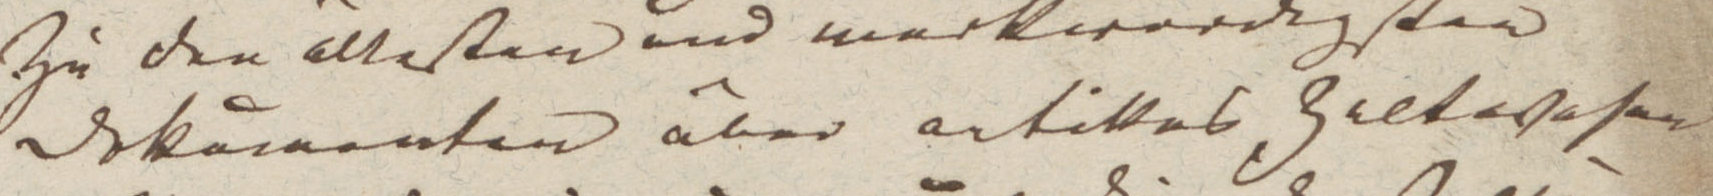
Dokumenten über antikes Zeltwesen
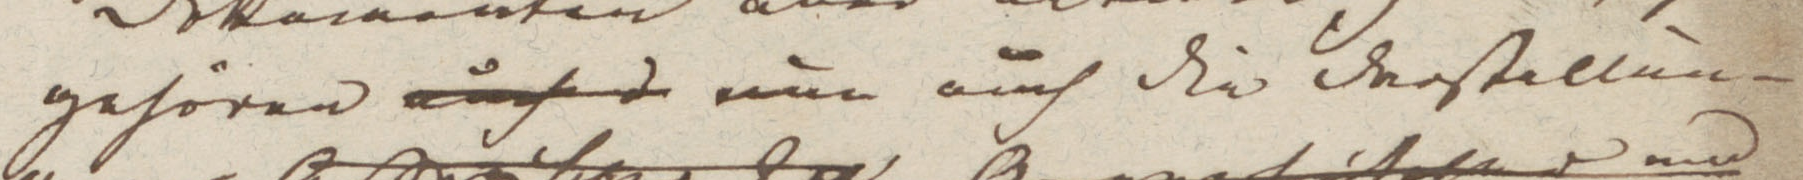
gehören auch d nun auch die Darstellun-
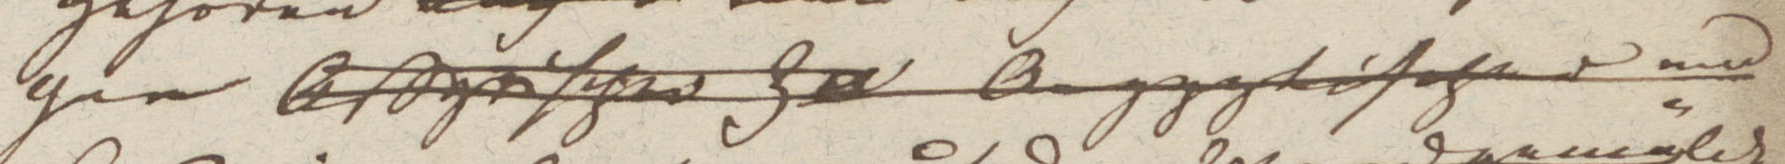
gen Assyrischer Zel Aegyptischer und
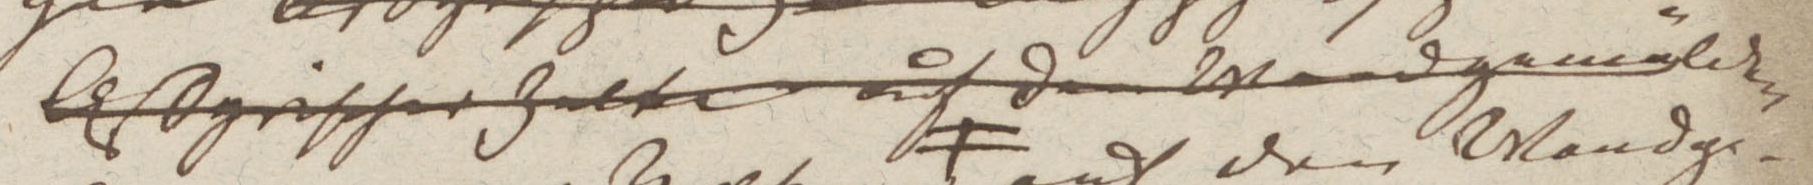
Assyrischer Zelte auf den Wandgemälden
